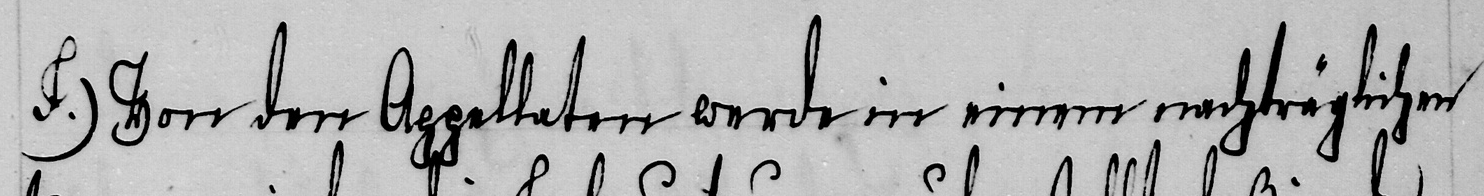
F.) Von den Appellaten werde in einem nachträglichen
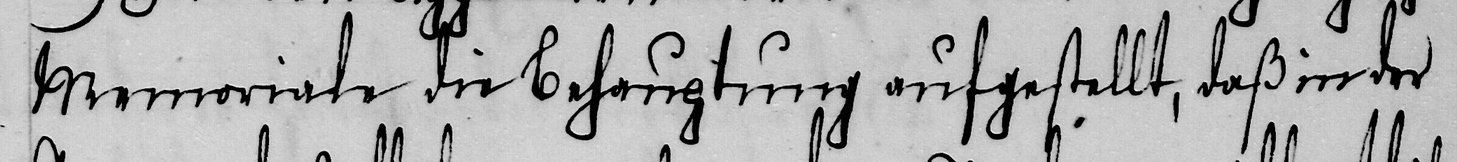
Memoriale die Behauptung aufgestellt, daß in der
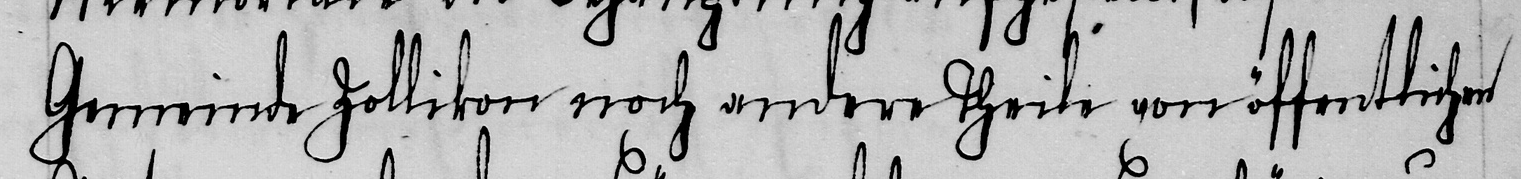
Gemeinde Zollikon noch andere Theile von öffentlichen
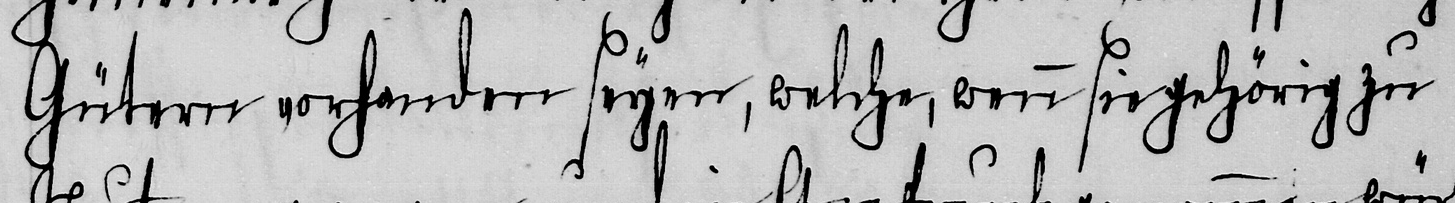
Gütern vorhanden seyen, welche, wenn sie gehörig zu
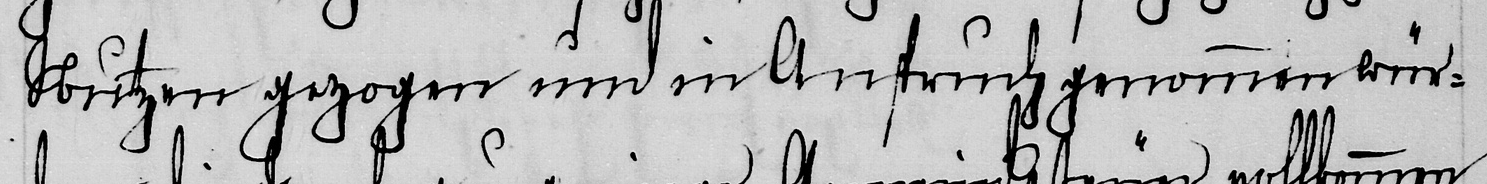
Nutzen gezogen und in Anspruch genommen wür¬
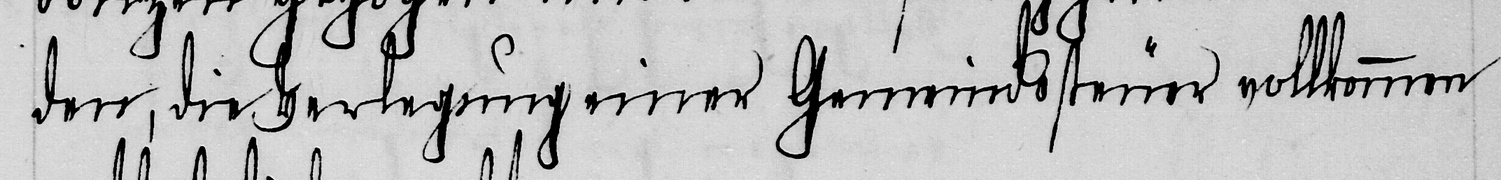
den, die Verlegung einer Gemeindssteuer vollkommen
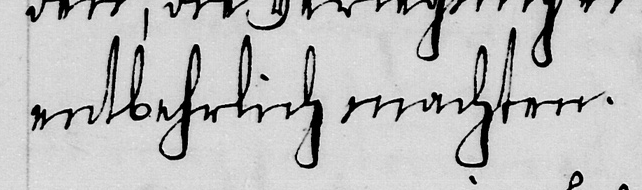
entbehrlich machten.
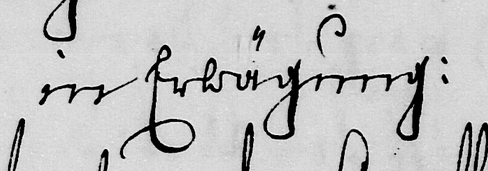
in Erwägung:
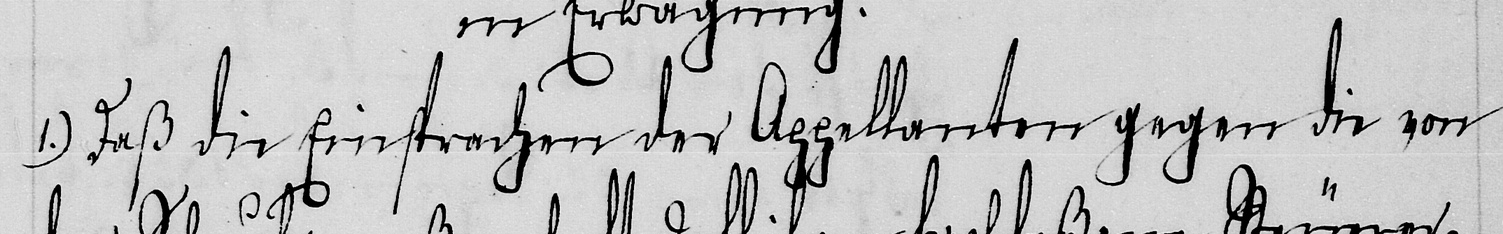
1.) Daß die Einsprachen der Appellanten gegen die von
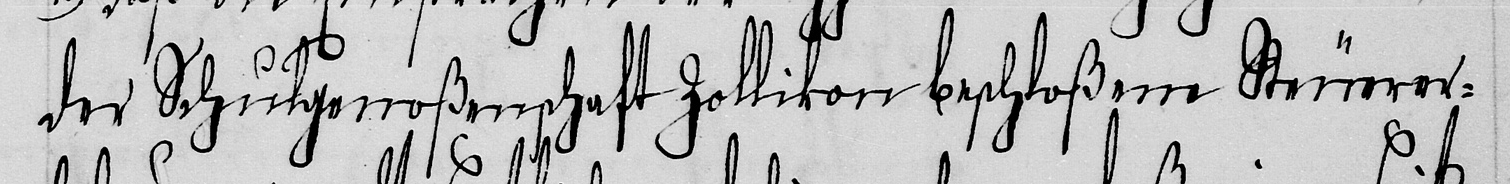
der Schulgenoßenschaft Zollikon beschloßene Steuer¬
